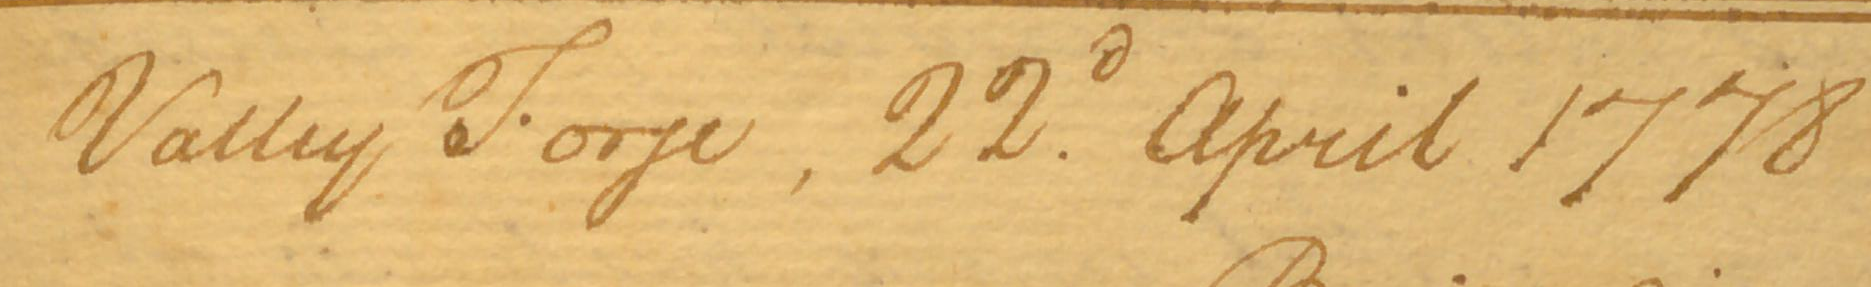Valley Forge, 22^d. April 1778
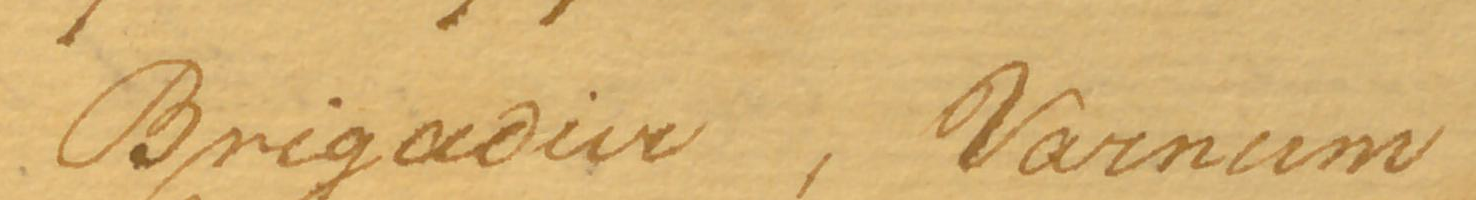Brigadier, Varnum
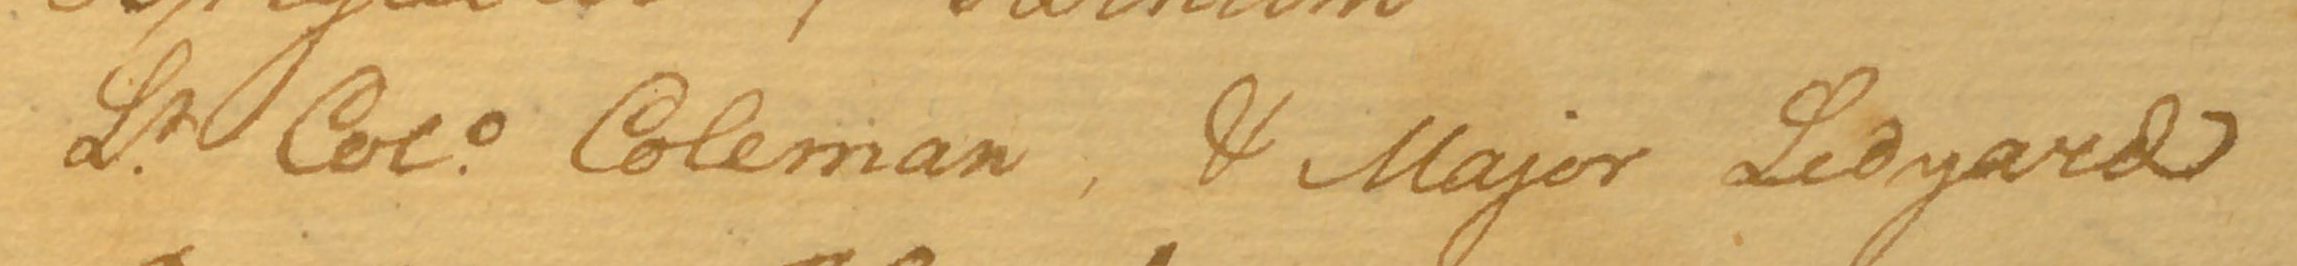L^t. Col^o. Coleman, & Major Ledyard
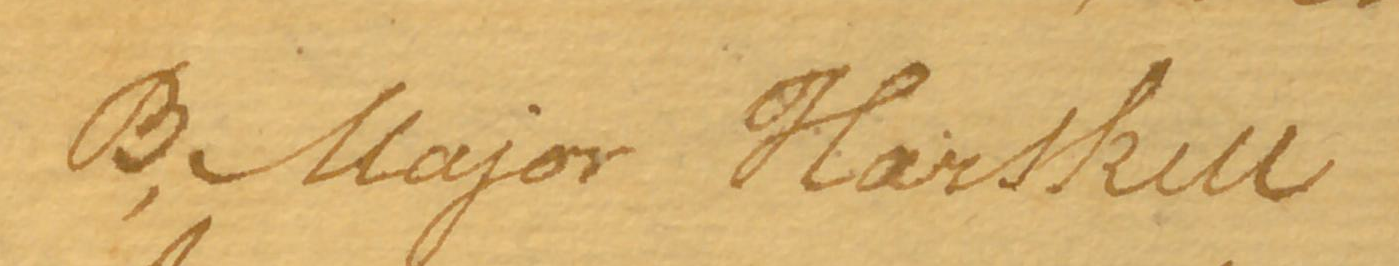B, Major Harskill
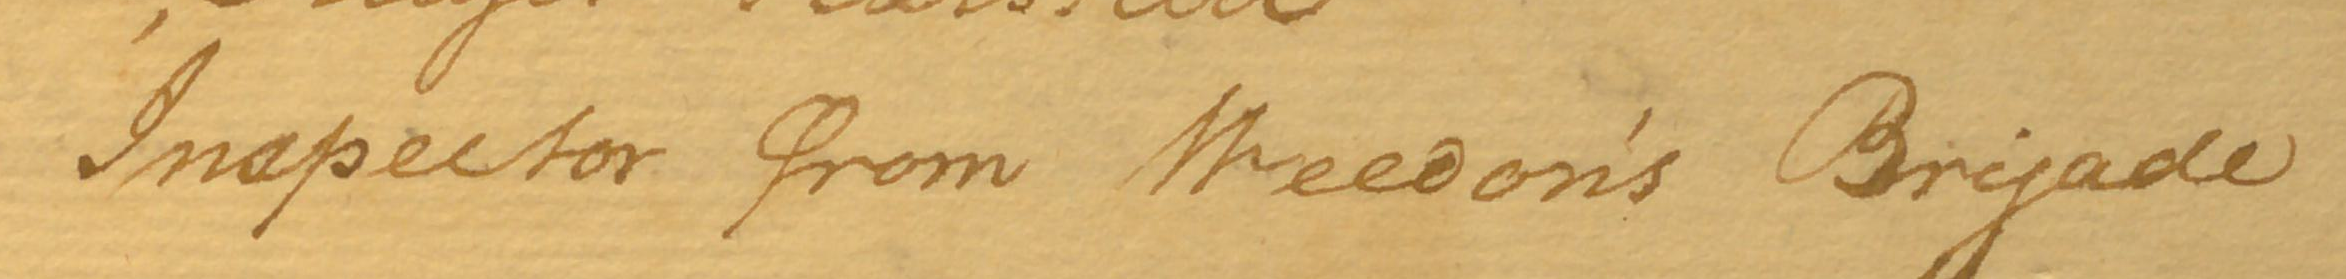Inspector from Weedon's Brigade
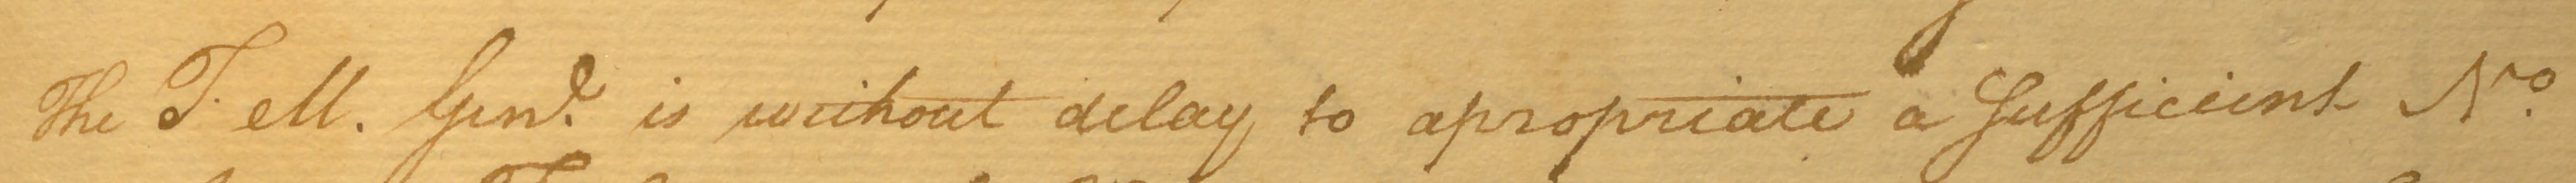The F M. Gen^l. is without delay to apropriate a sufficient N^o.
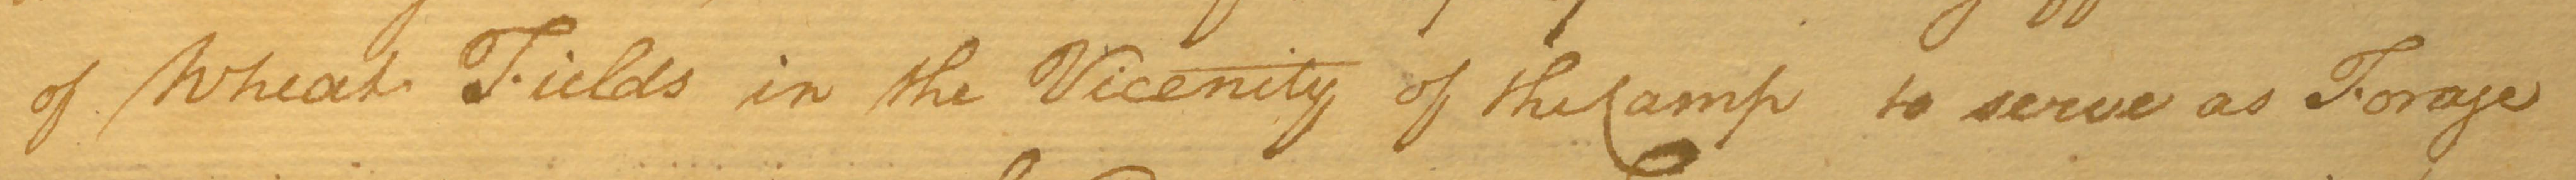of Wheat Fields in the Vicenity of the Camp to serve as Forge
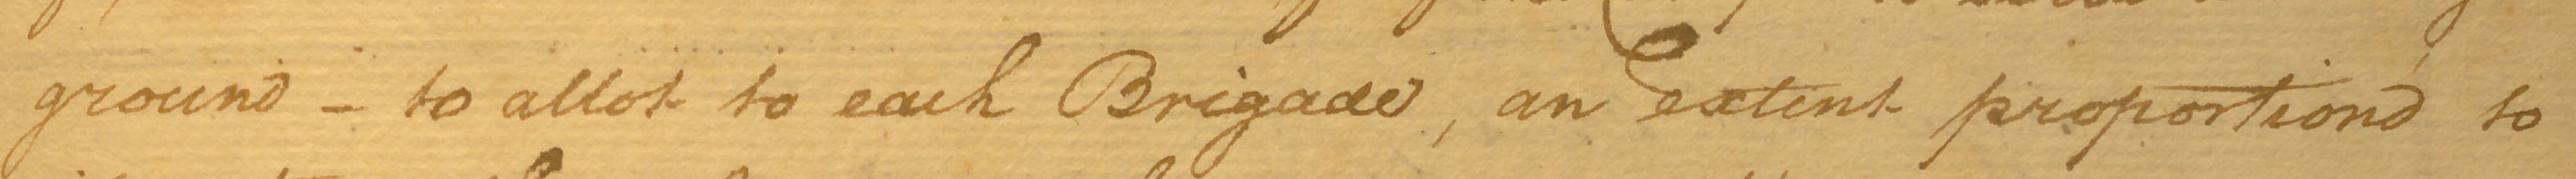ground- to allot to each Brigade, an extent proportion'd to
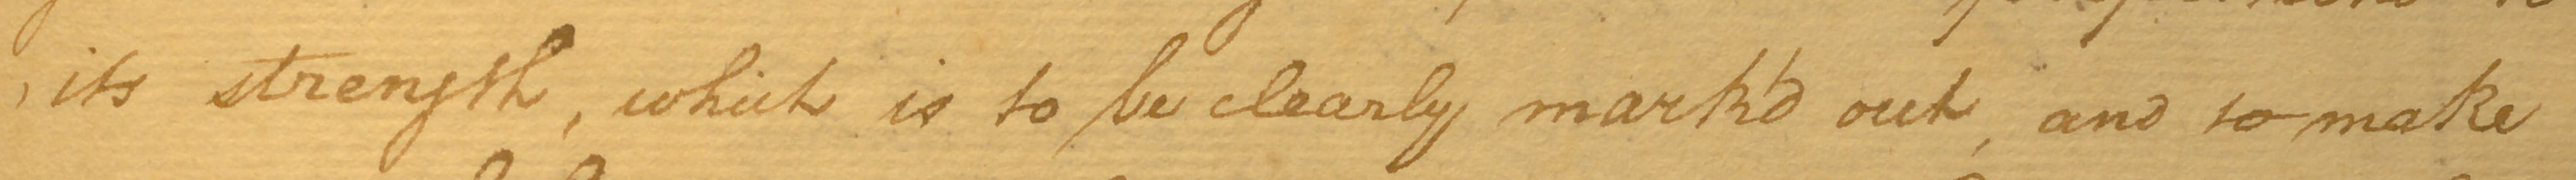its strength, which is to be clearly mark'd out, and to make
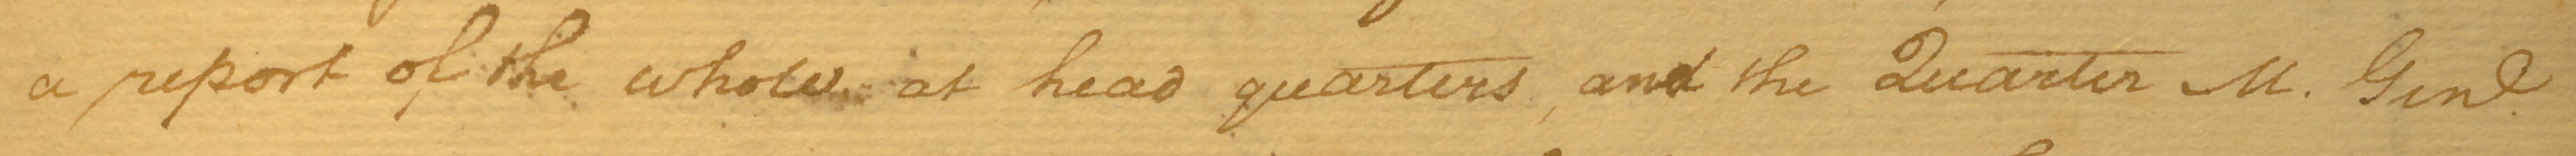a report of he whole at head quarters, and the Quart M. Gen^l.
